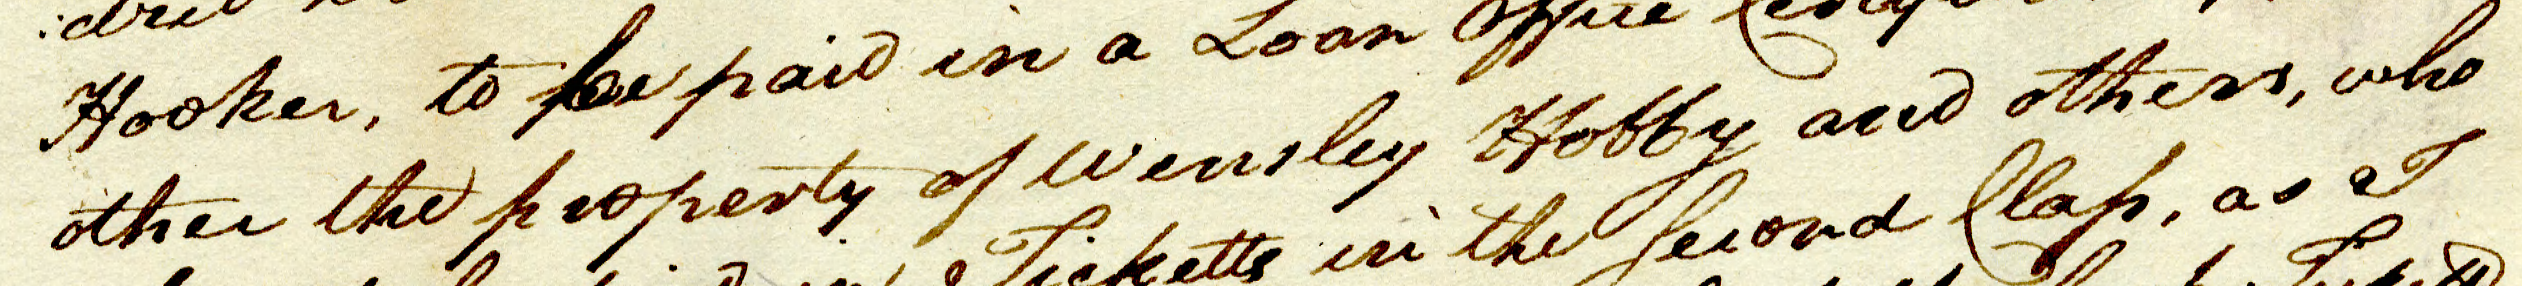other the property of Wensley Hobby and others, who
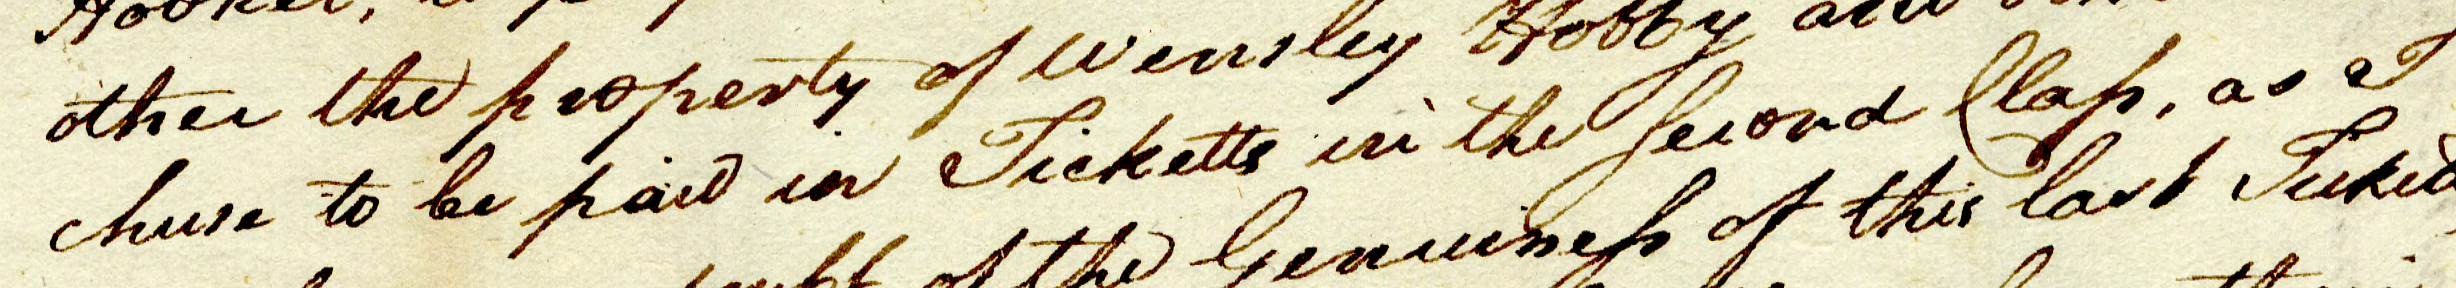chuse to be paid in Tickets in the second Class, as I
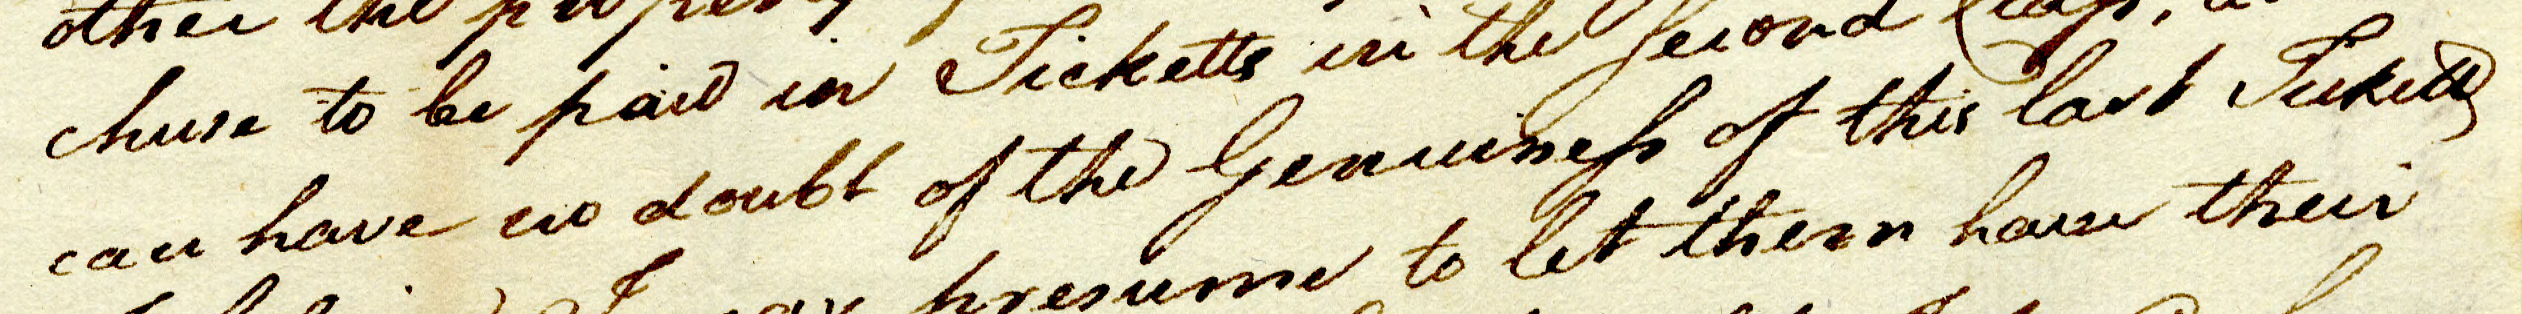can have no doubt of the Genuiness of this last Tickett
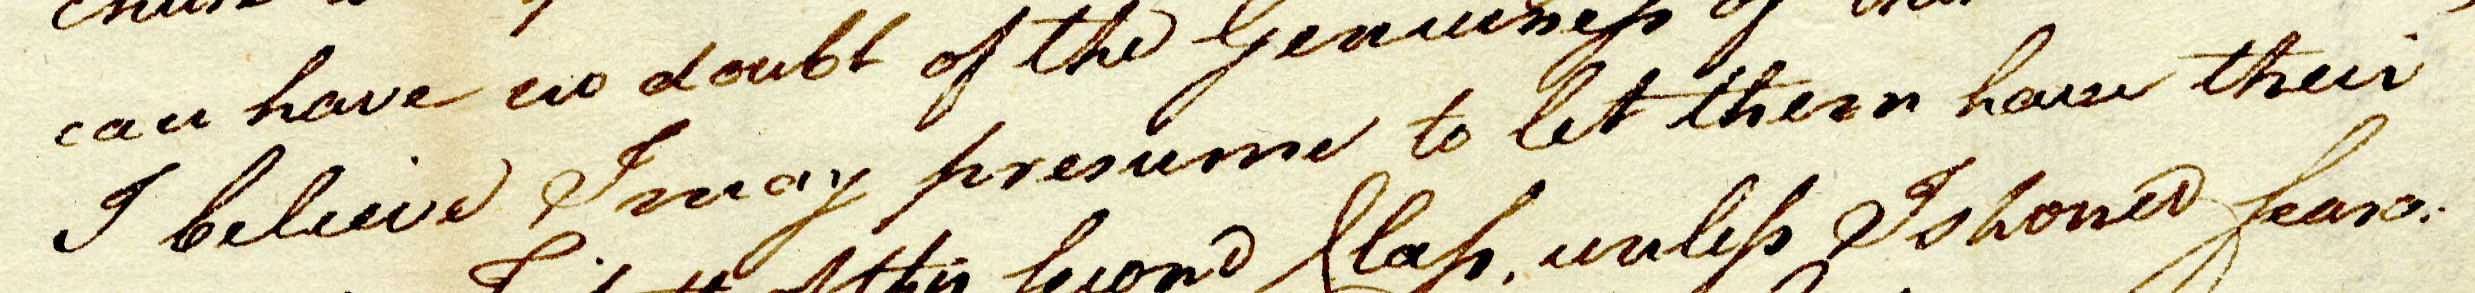I believe I may presume to let them have their
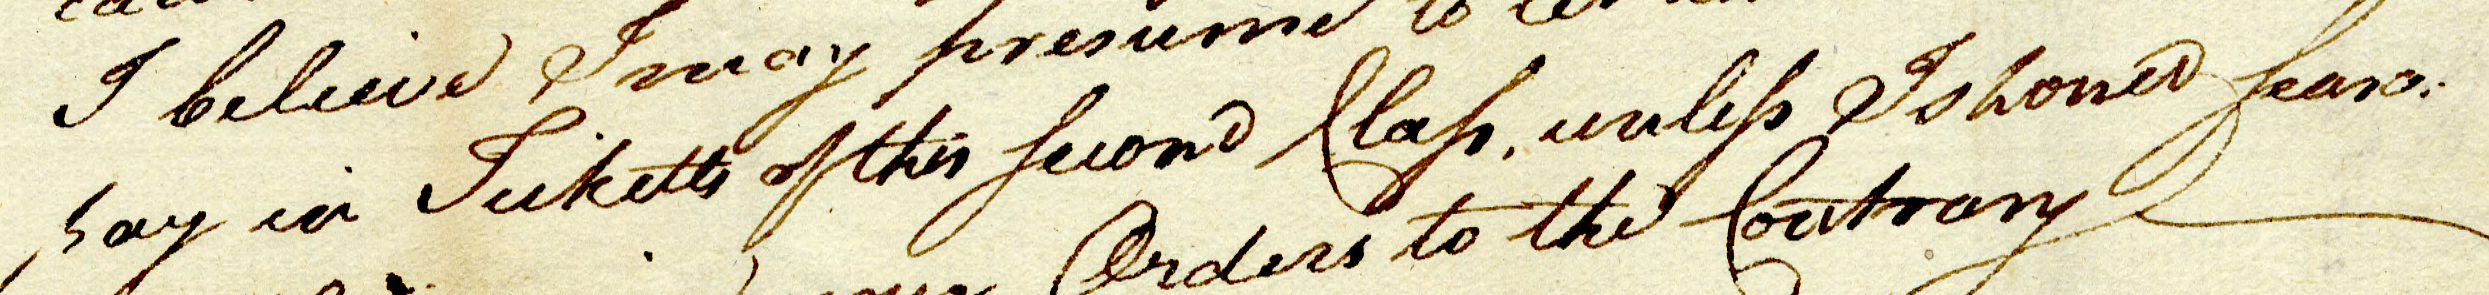pay in Ticketts of this second Class, unless I should sear
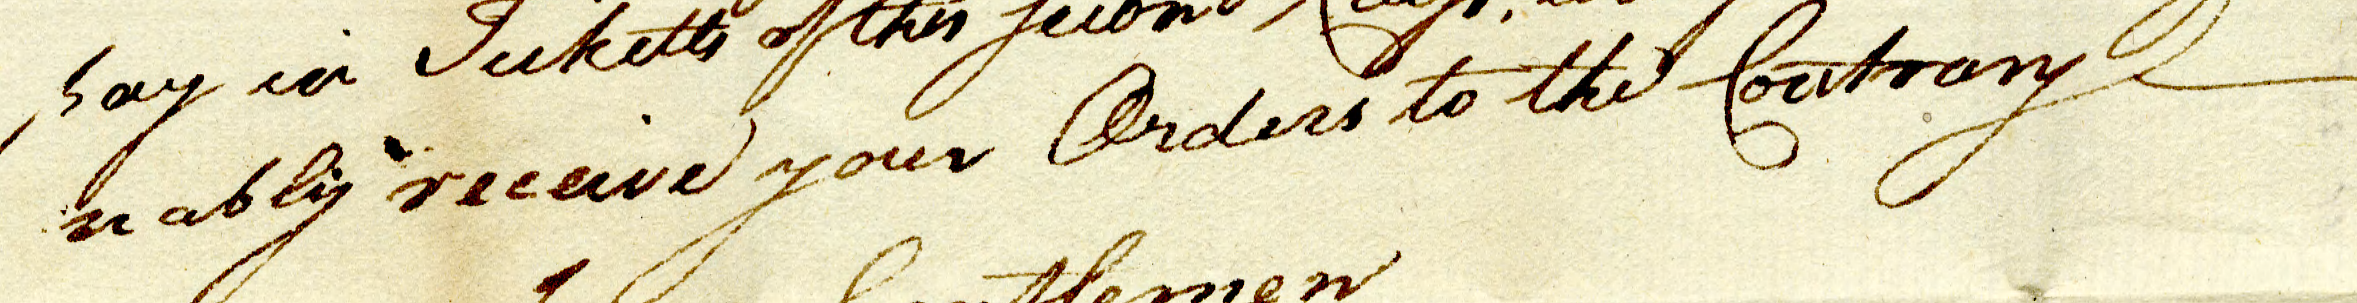re ably receive your Orders to the Contrary
